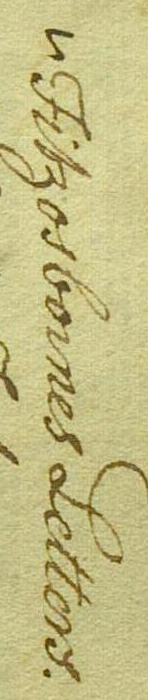- Fitzosbornes Letters.
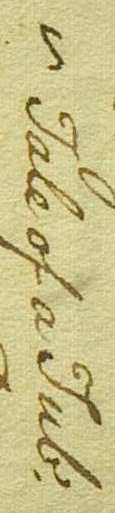- Tale of a Tub.
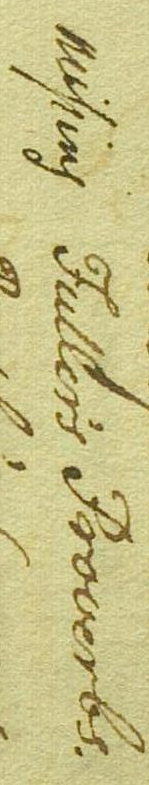reissing Fuller's Proverbs.
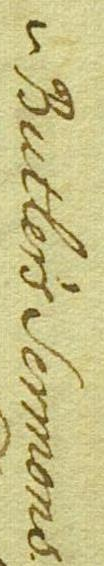- Butler's Sermons.
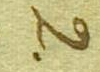2.
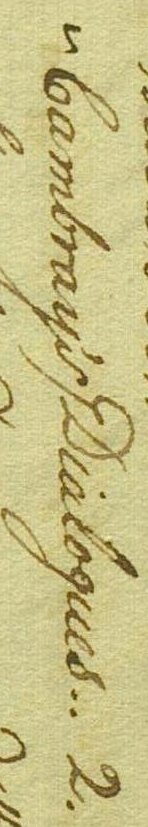- Cambray's Dialogues.. 2.
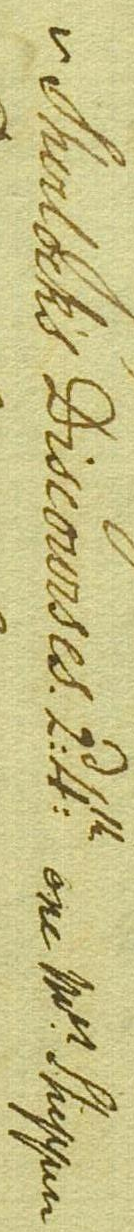- Sherlock's Discourses. 2^d: 4^th: one M^s. Shippen
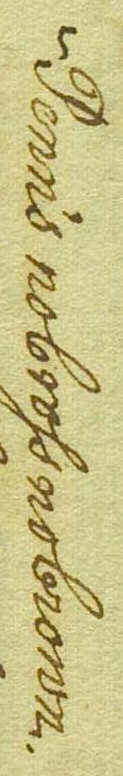- Penn's no Cross no Crown.
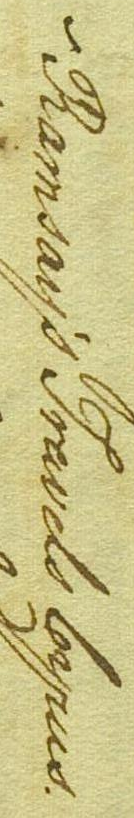- Ramsay's Travels Cyprus.
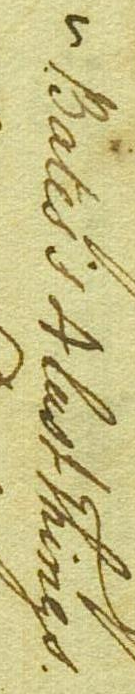- Bates's 4 last things.
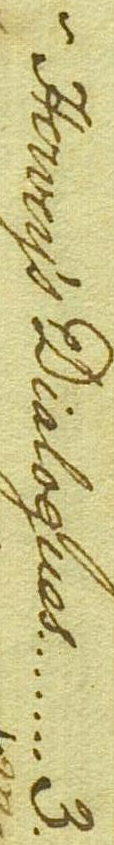- Hervey's Dialogues...... 3.
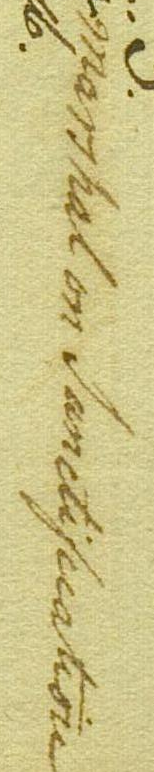- marshal on Sanctification.
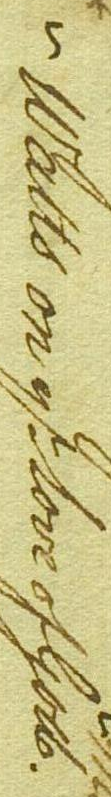- Watts on y^e Love of God.
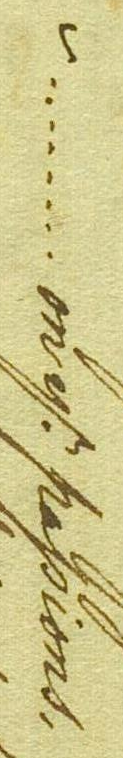- ........ on y^e passions.
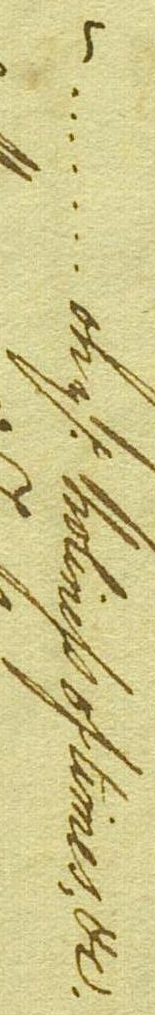- .... on y^e holiness of times, &c.
